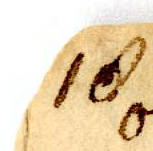18
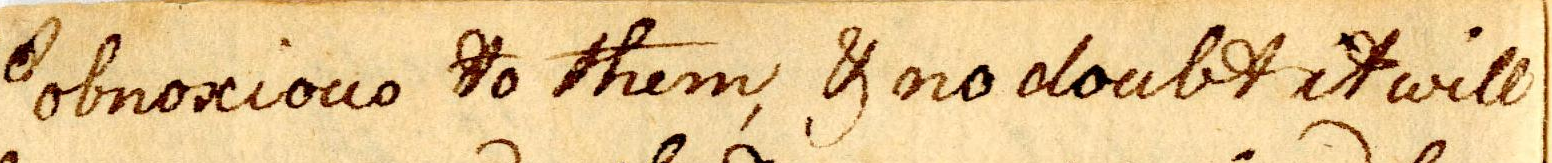obnoxious to them, & no doubt it will
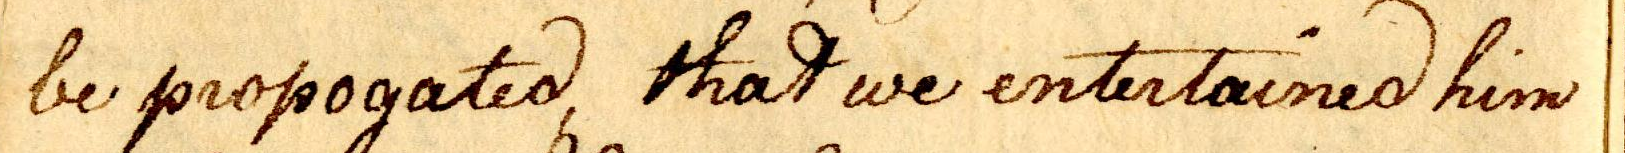be propogated, that we entertained him
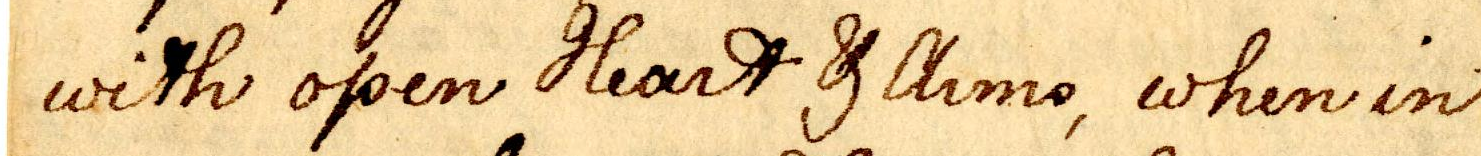with open Heart & Arms when in
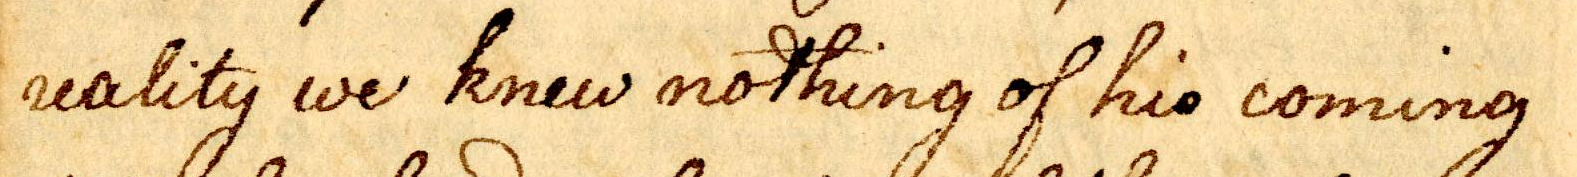reality we knew nothing of his coming
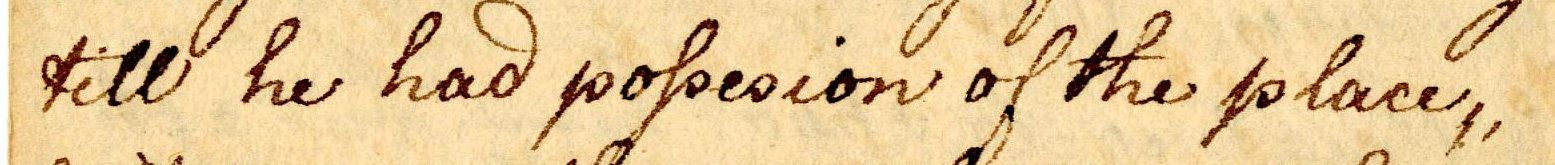till he had possesion of the place,
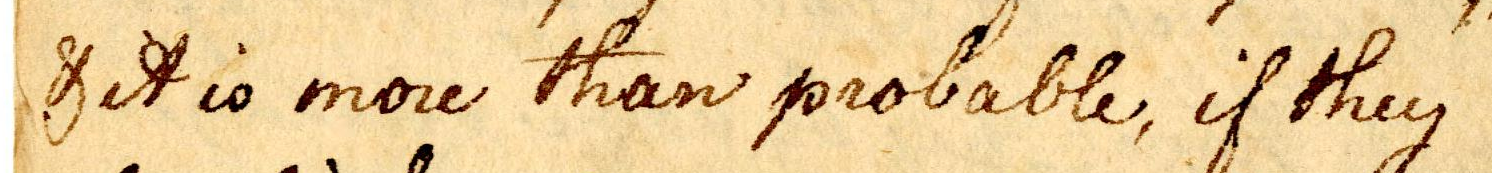& it is more than probable, if they
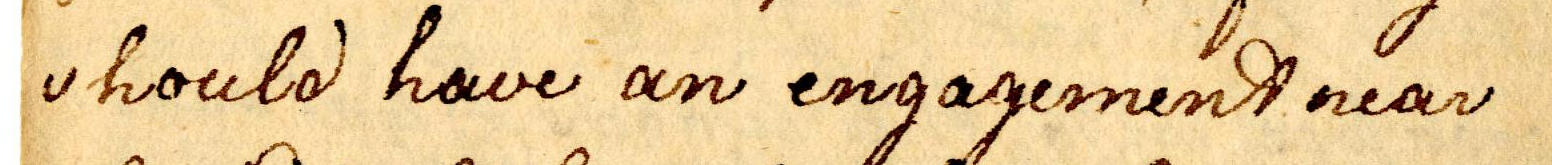should have an engagement near
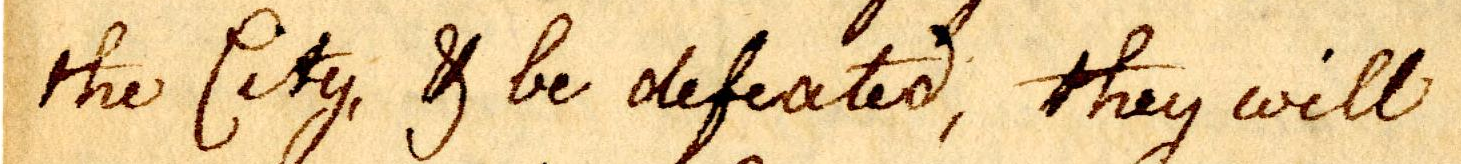the City, & be defeated, they will
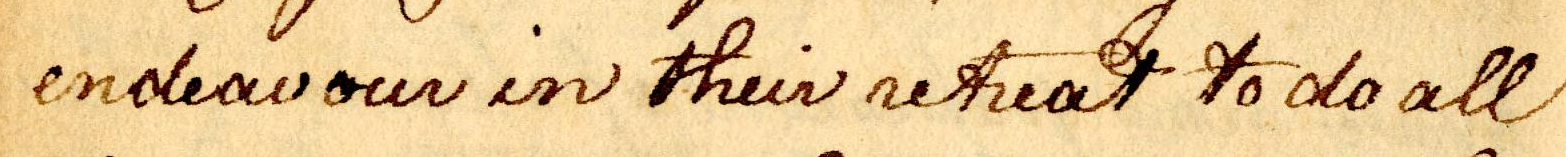endeavour in their retreat to do all
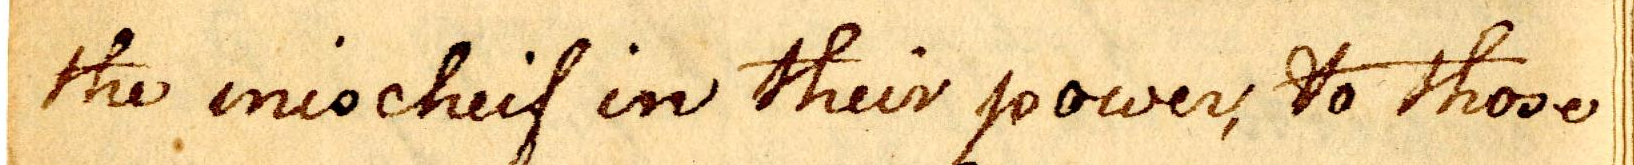the mischeif in their power, to those
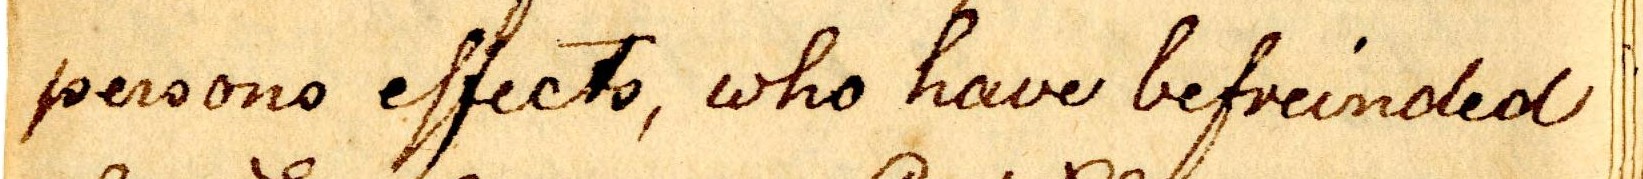persons effects, who have befreinded
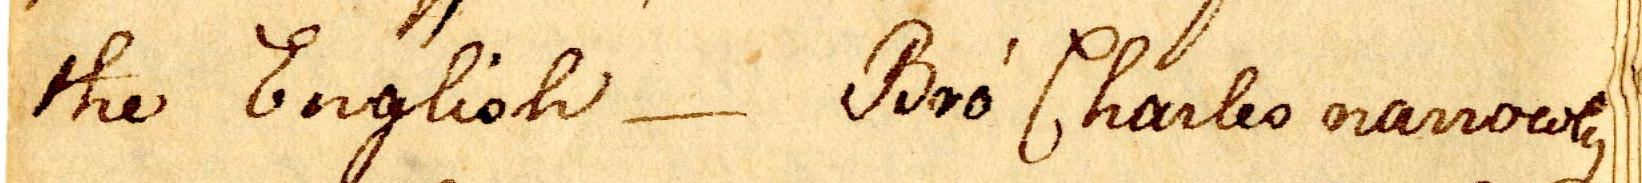the English- Bro' Charles narrowly
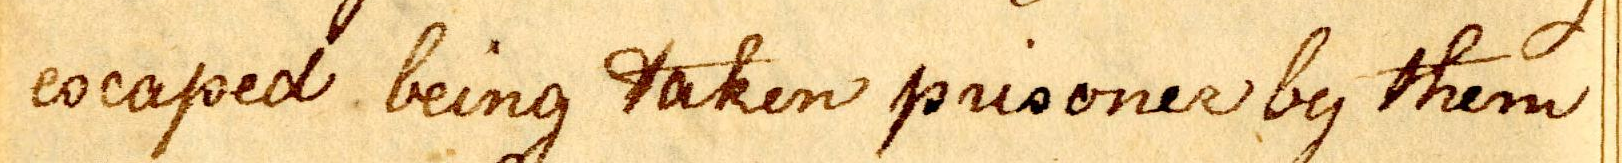escaped being taken prisoner by them
